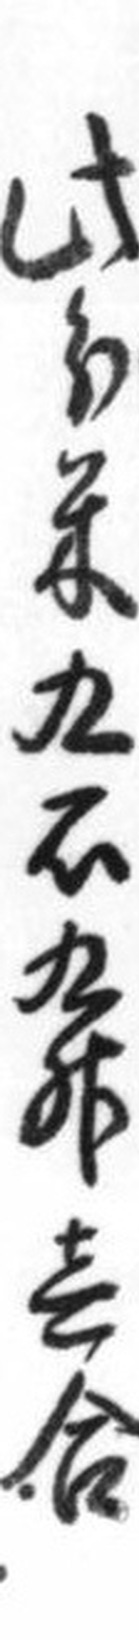此分米九石九升壱合
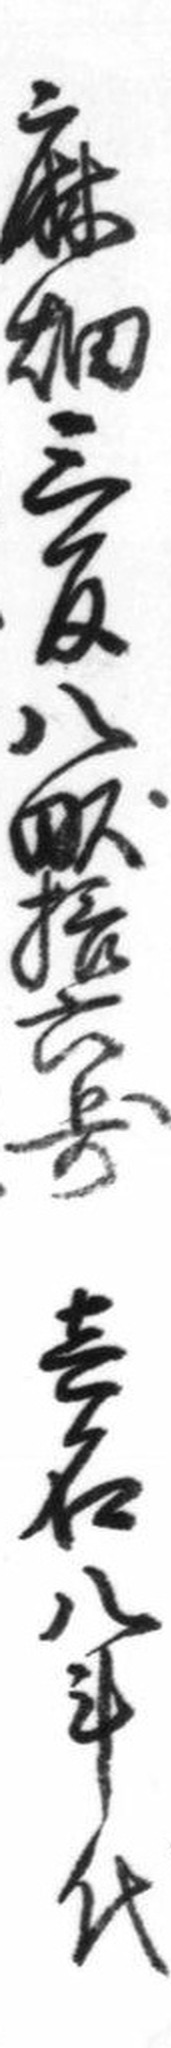麻畑三反八畝拾六歩壱石八斗代
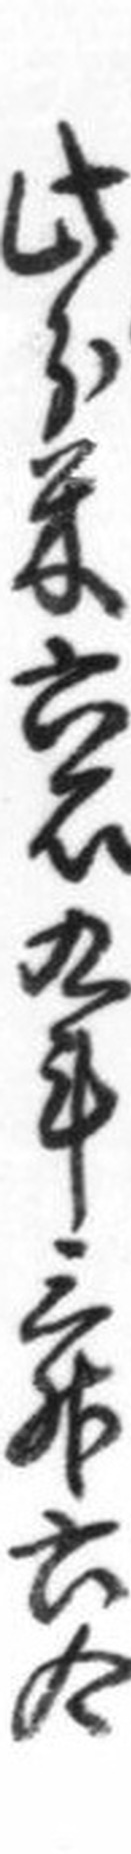此分米六石九斗三升六合
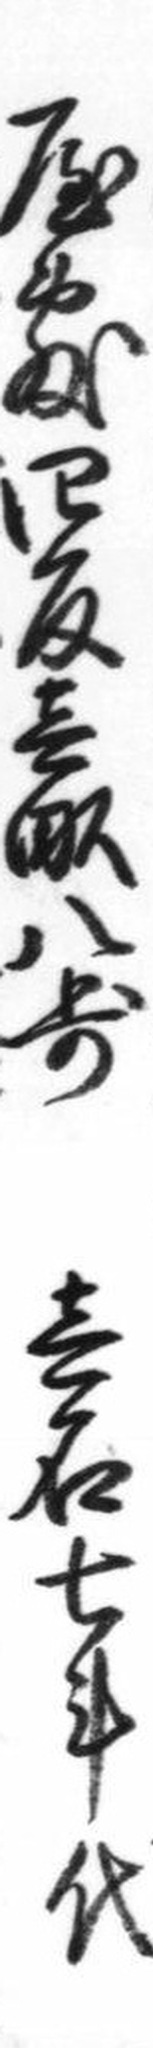屋敷四反壱畝八歩壱石七斗代
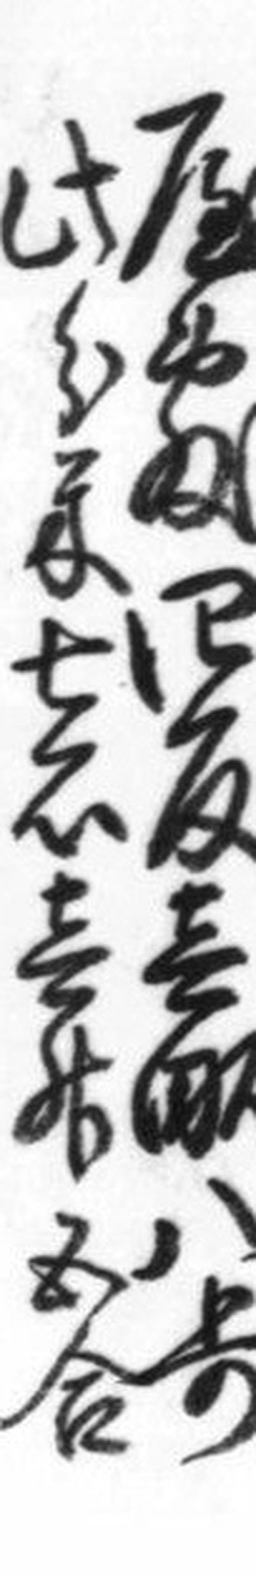此分米七石壱升五合
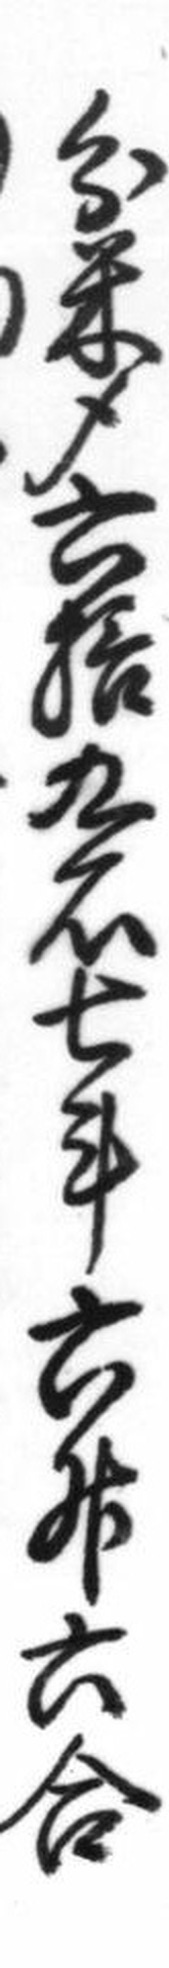分米〆六拾九石七斗六升六合
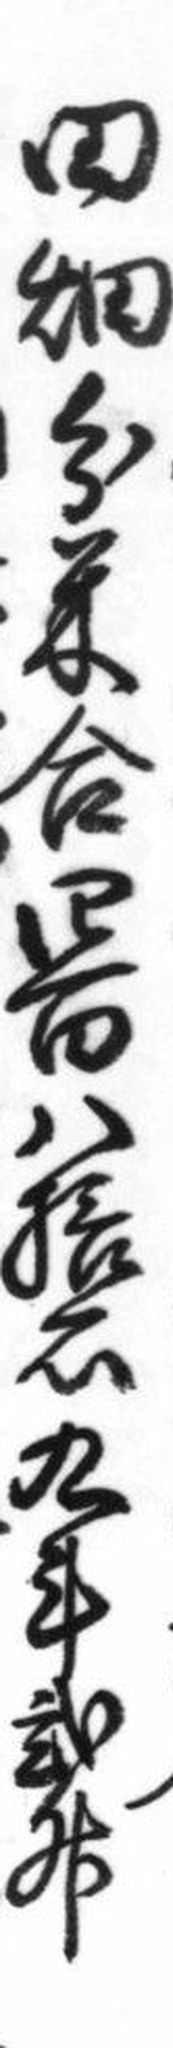田畑分米合四百八拾石九斗弐升
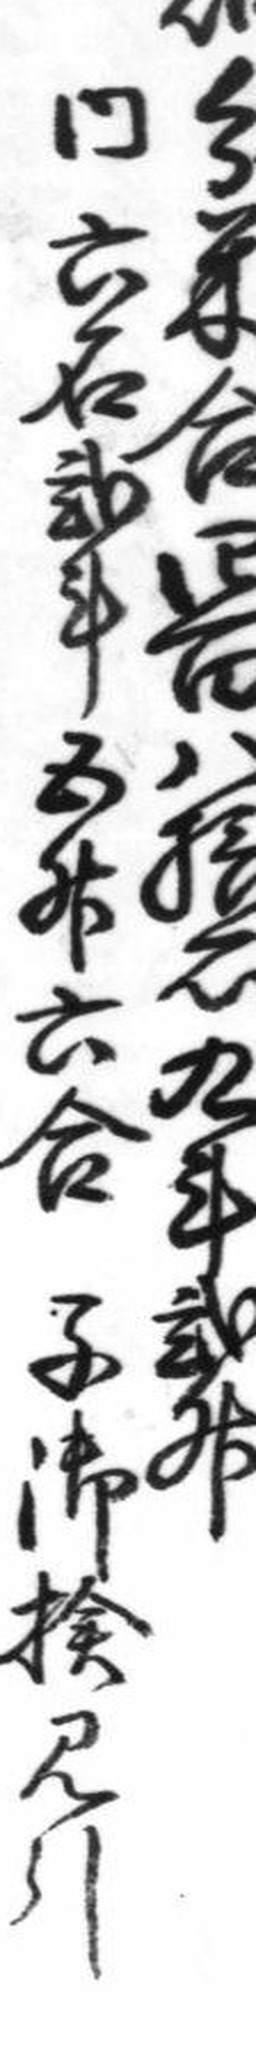内六石弐斗五升六合子御検見引
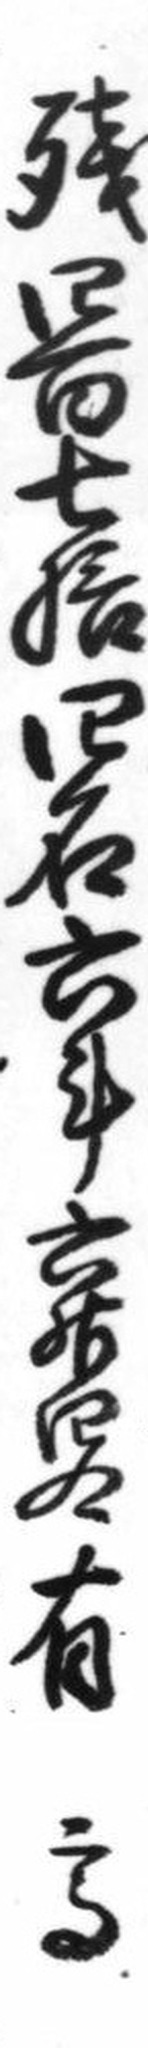残四百七拾四石六斗六升四合有高
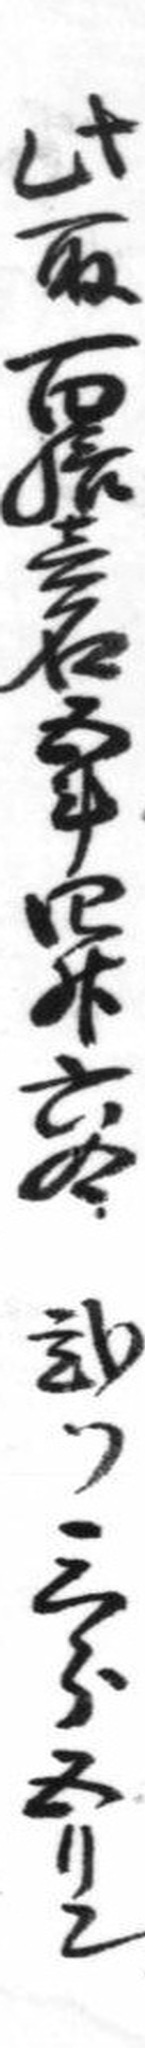此取百拾壱石五斗四升六合弐ツ三分五リン
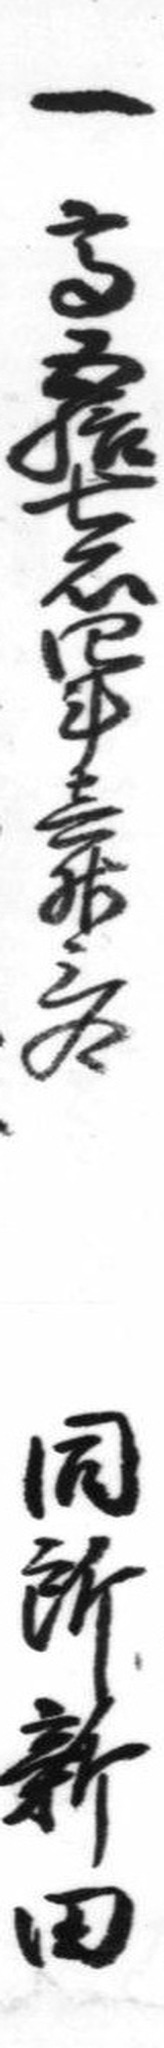一高五拾七石四斗壱升三合同所新田
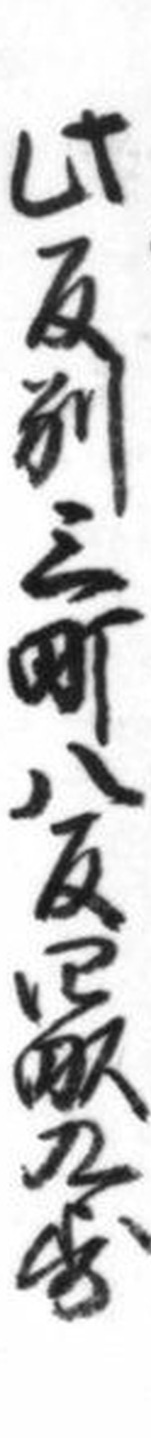此反別三町八反四畝九歩
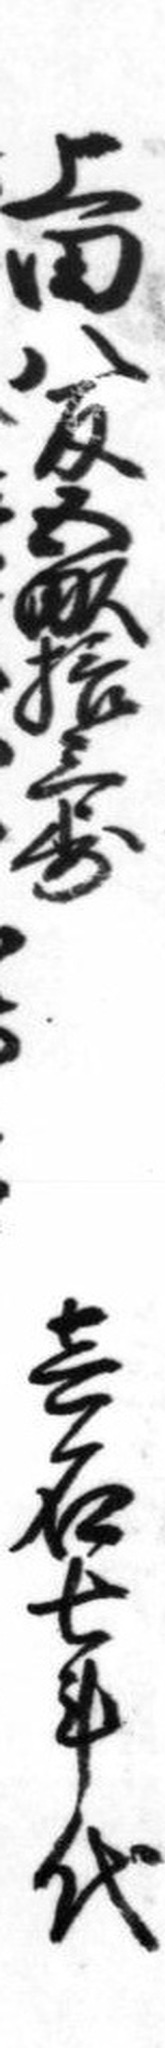上田八反五畝拾三歩壱石七斗代
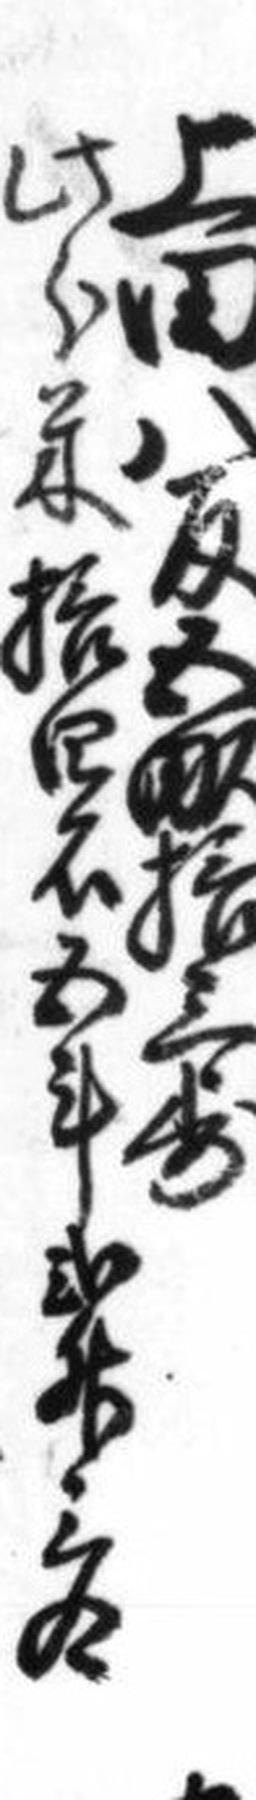此分米拾四石七斗弐升五合
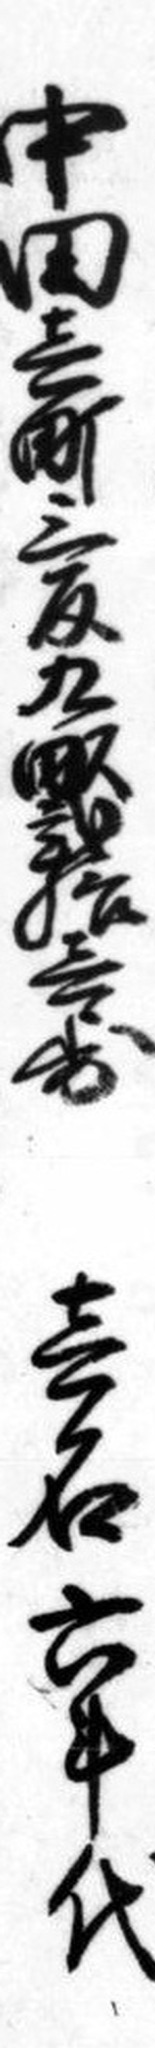中畑弐町弐反八畝拾七歩壱石四斗代
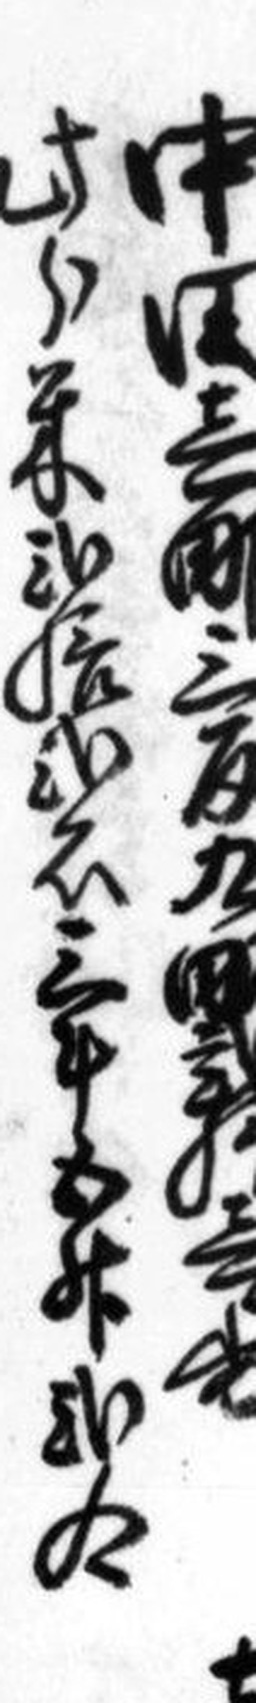此分米拾四石七斗弐升五合
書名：越前国大野郡今井村明細帳
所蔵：福井県文書館 Fukui Prefectural Archives
